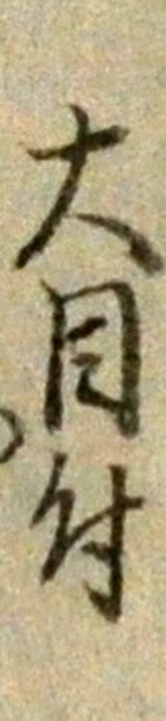大目付
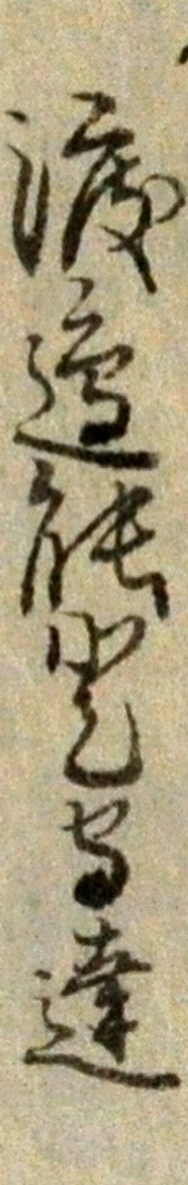渡辺能登守達
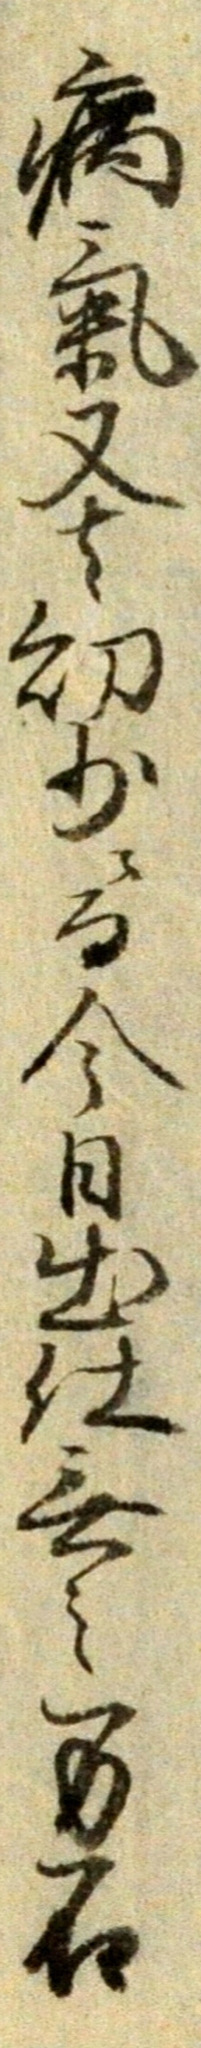病気又は幼少にて今日出仕無之万石
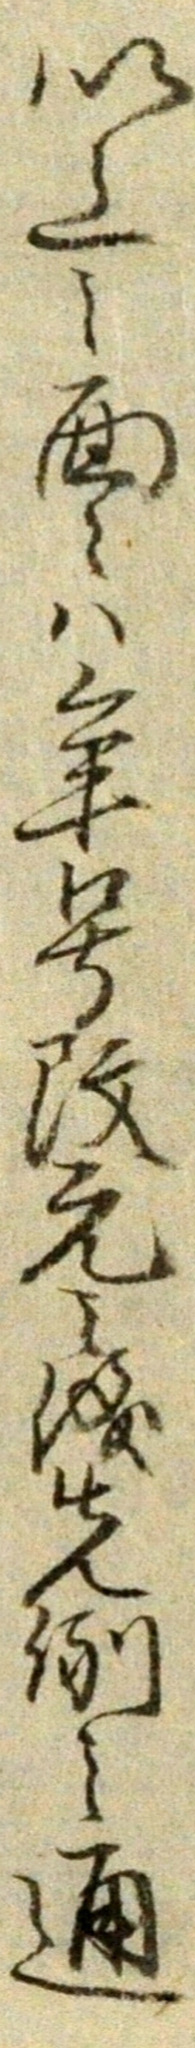以上之面々は年号改元之儀先例之通
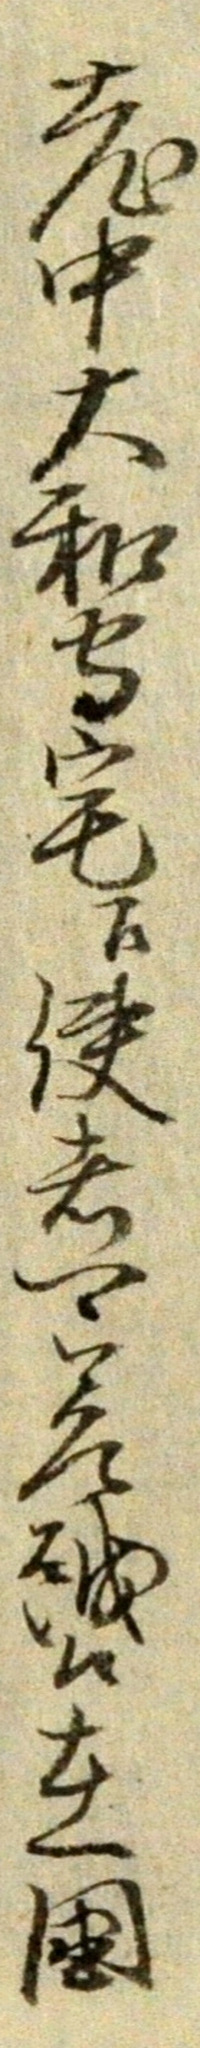老中大和守宅え使者可差越候在国
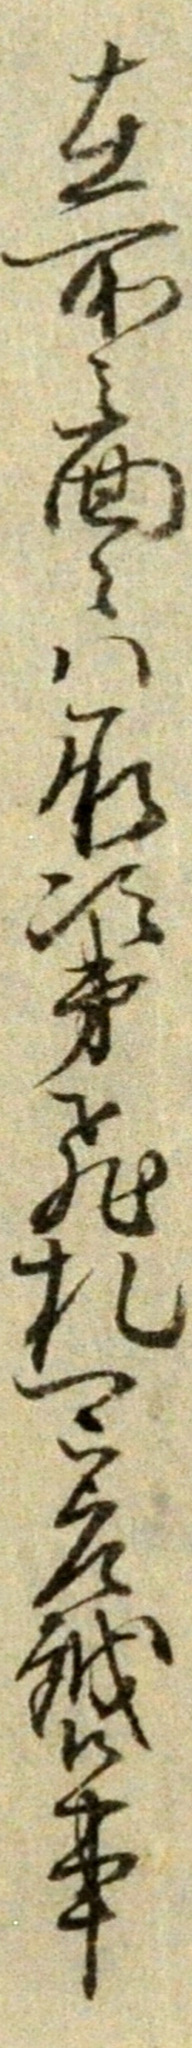在所之面々は承次第飛札可差越候事

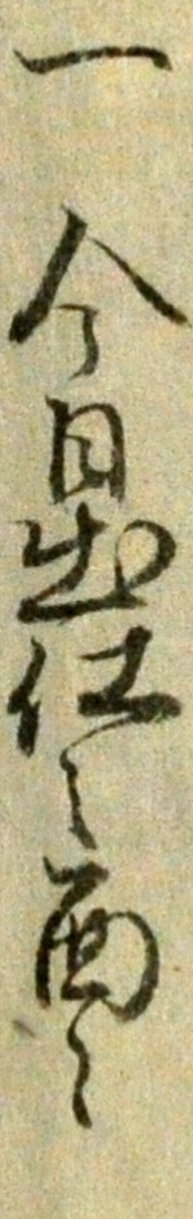一今日出仕之面々
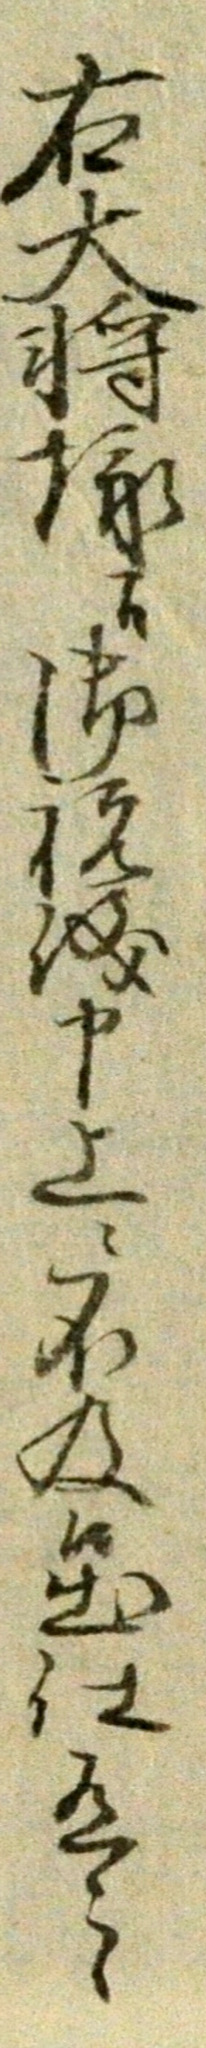右大将様え御祝儀申上に不及候出仕有之
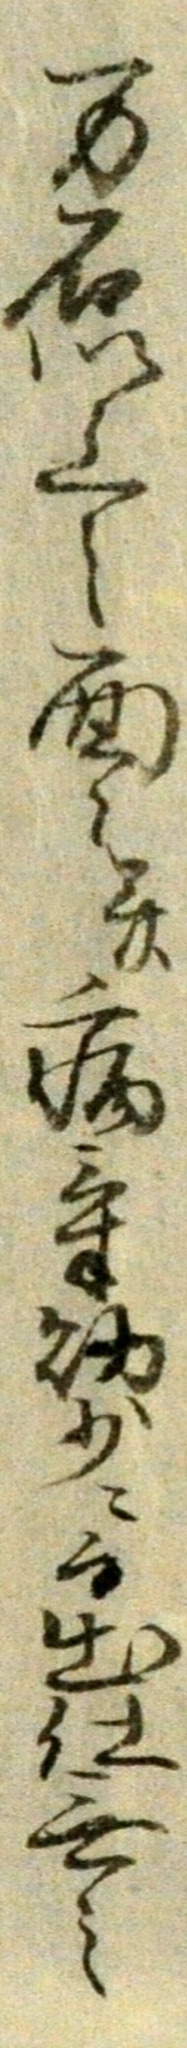万石以上之面々并病気幼少にて出仕無之
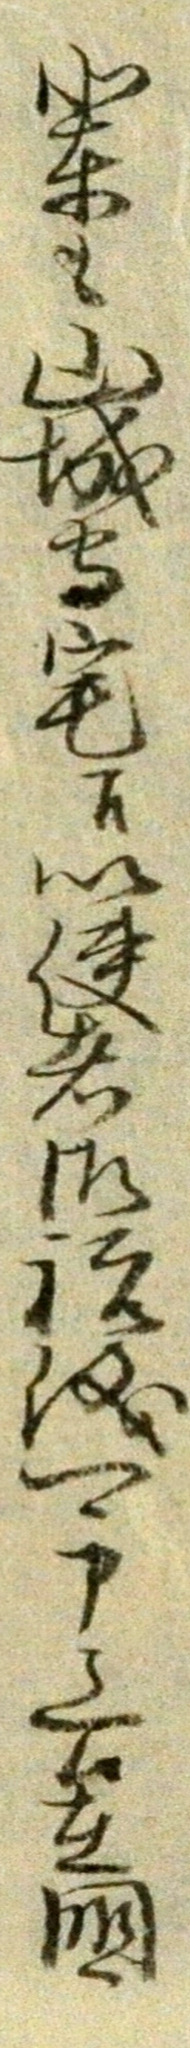輩も山城守宅え以使者御祝儀可申上候在国
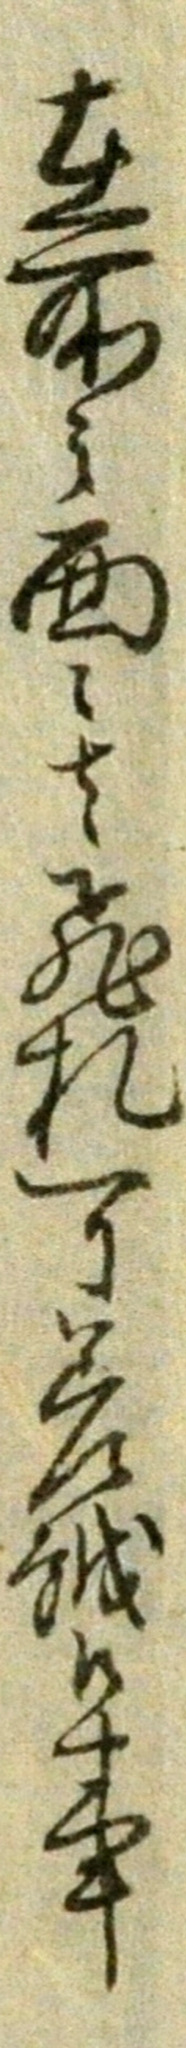在所之面々は飛札可差越候事
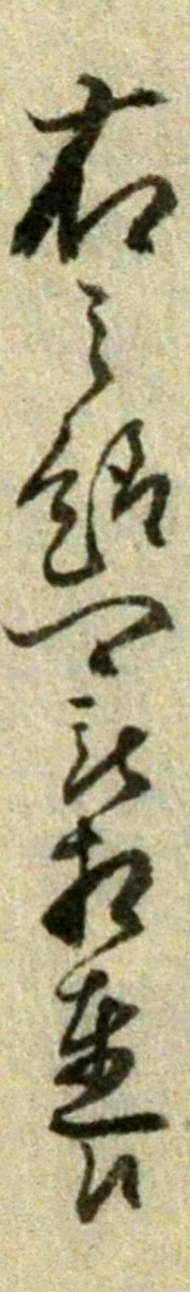右之趣可被相達候
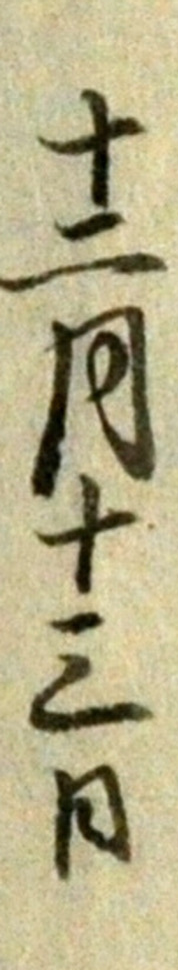十二月十三日

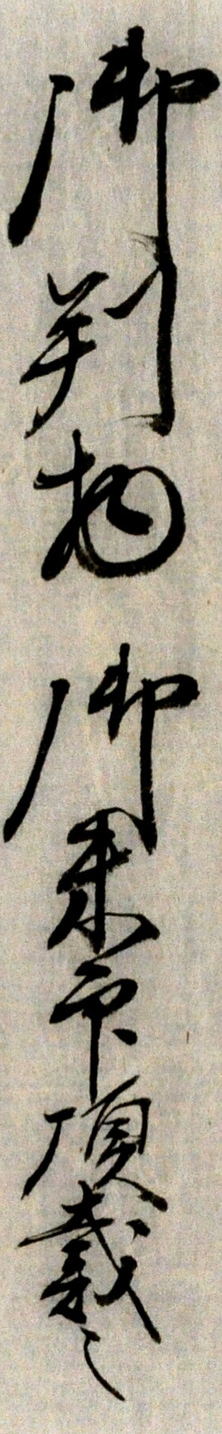御判物御朱印頂戴之
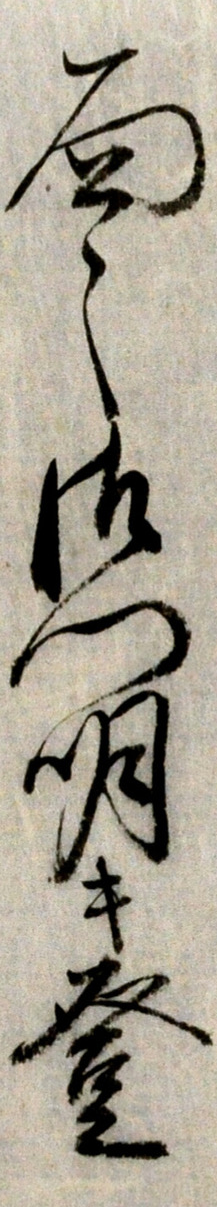面々御門明キ登
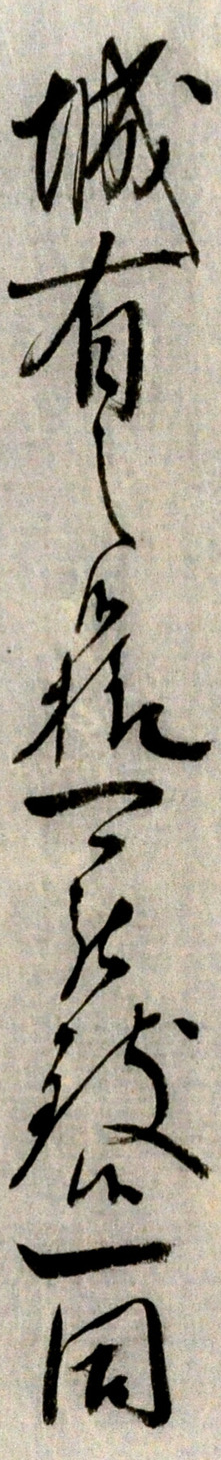城有之候様可被致候一同
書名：申合帳〔一括〕
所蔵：伊那市立高遠町図書館・合同会社AMANE
